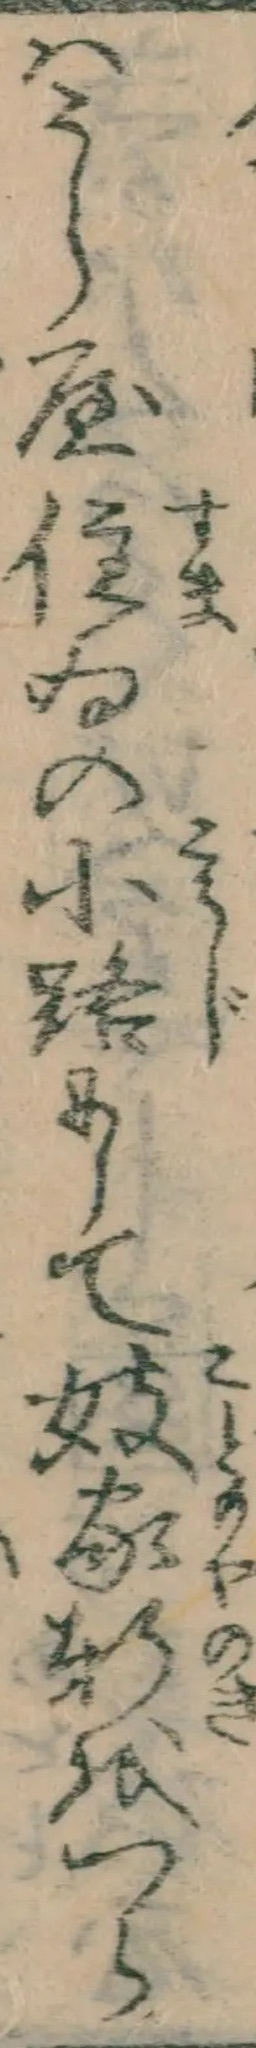はうし屋住ゐの小路にして妓家軒をつら
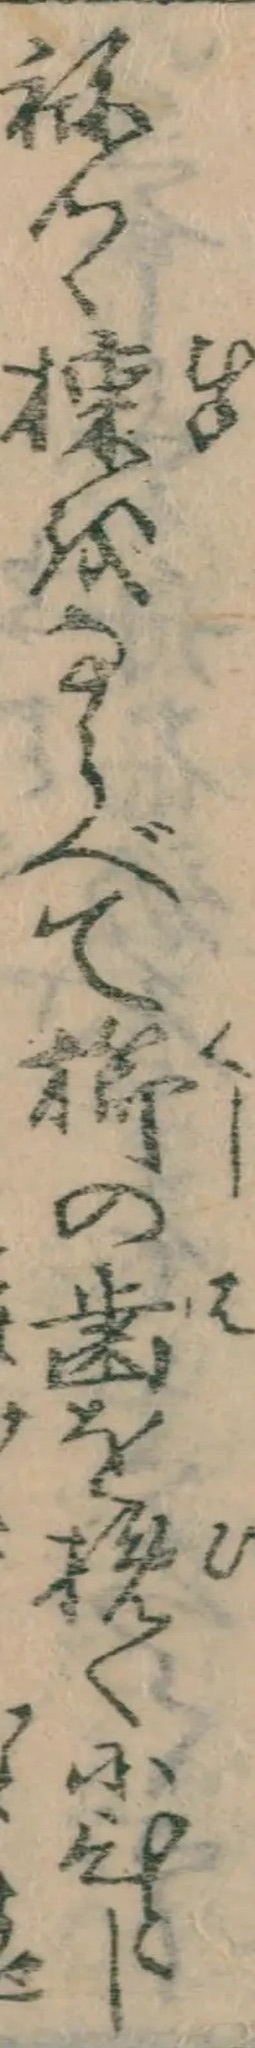ねつゝ棟をならべて櫛の歯を挽くにひとし
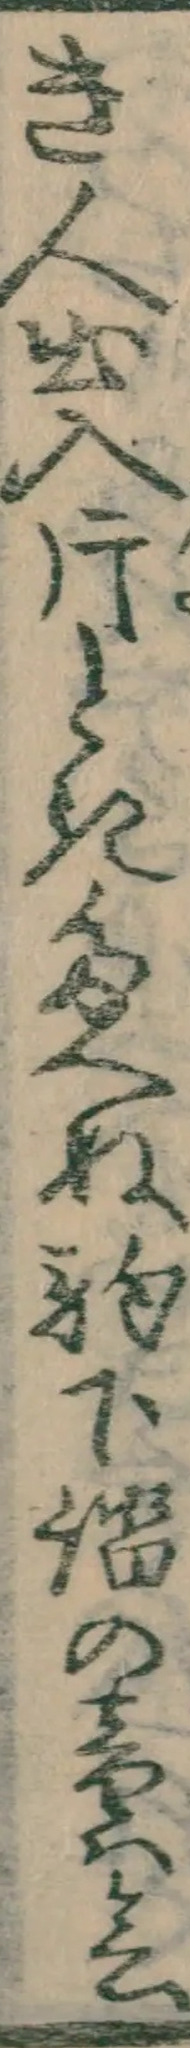き人出入片ときたへぬ駒下踏の音は会
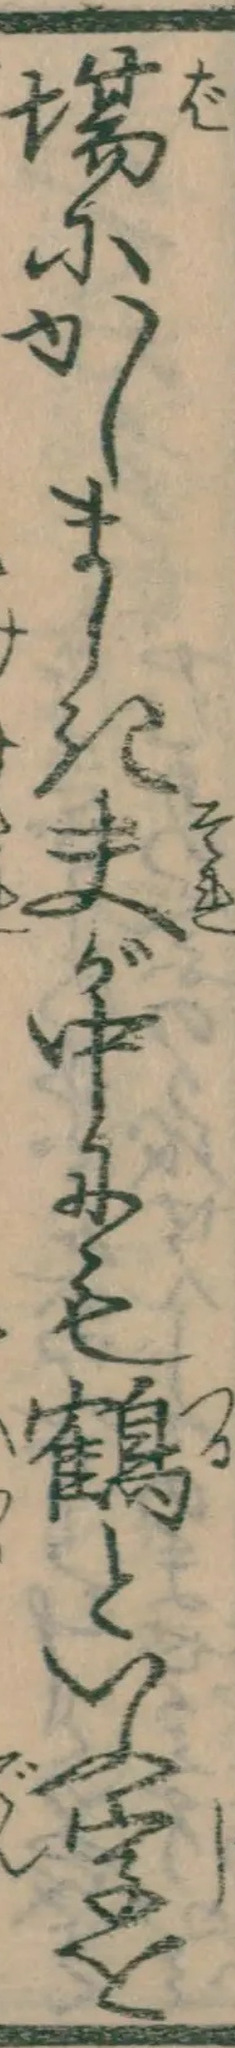場にかしましき夫が中にも鶴といふ字を
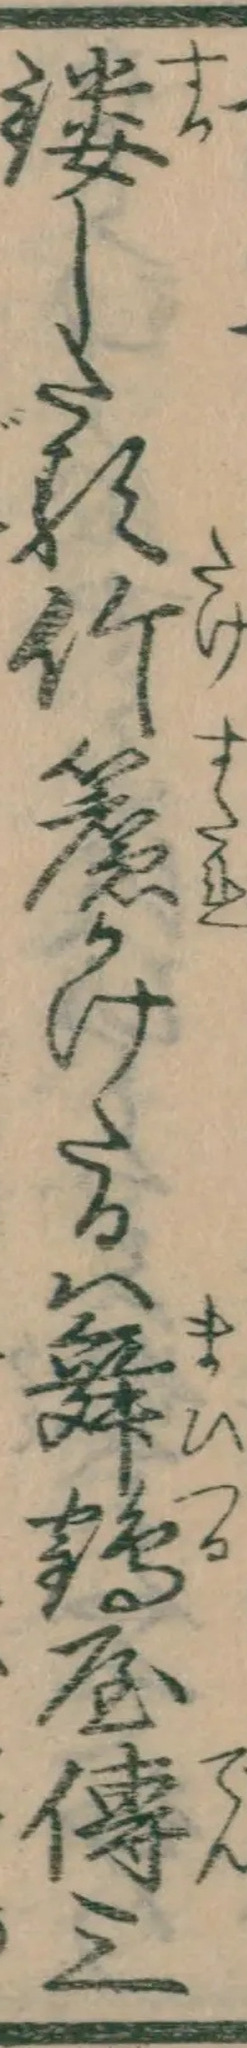鏤したる竹簾かけたるは舞鶴屋伝三
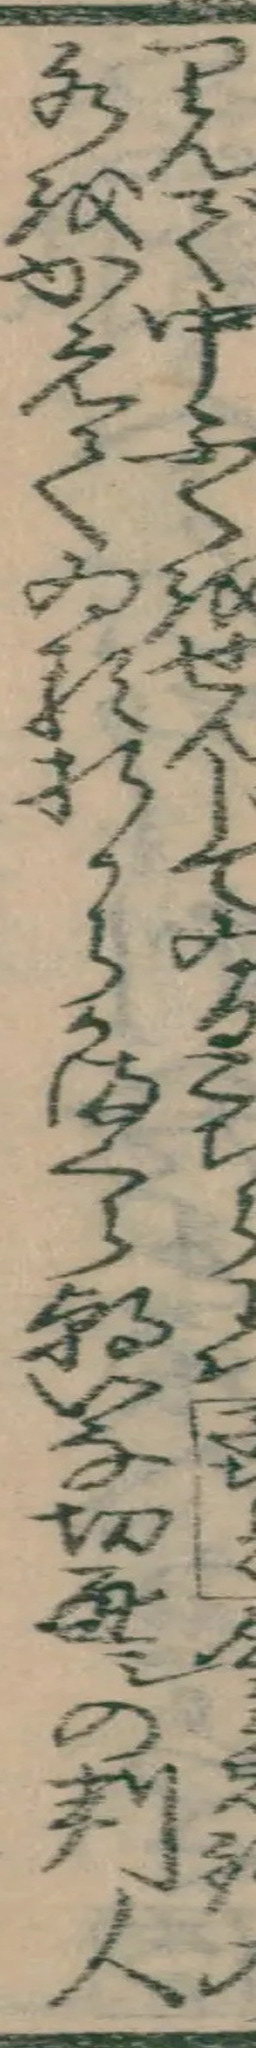水をかえてゐる折からかまくら朝いな切通しの判人
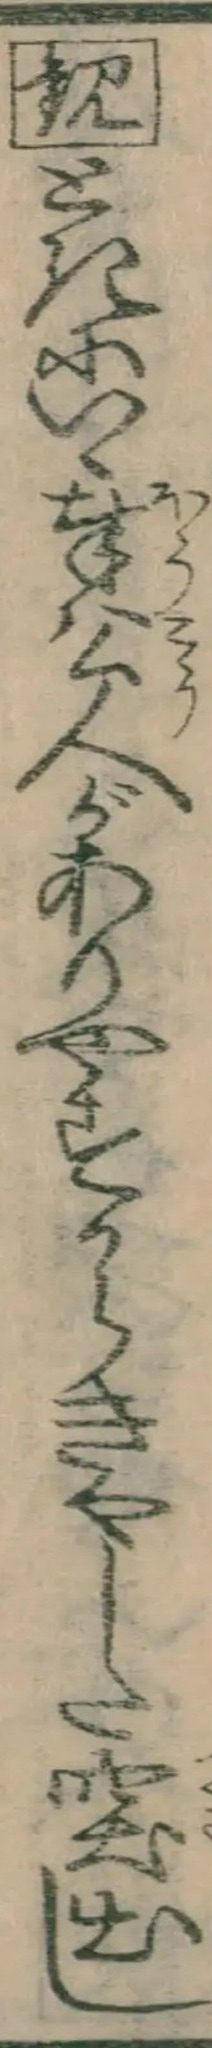〈観〉ときにいゝ奉公人がありやすからきやした突出し
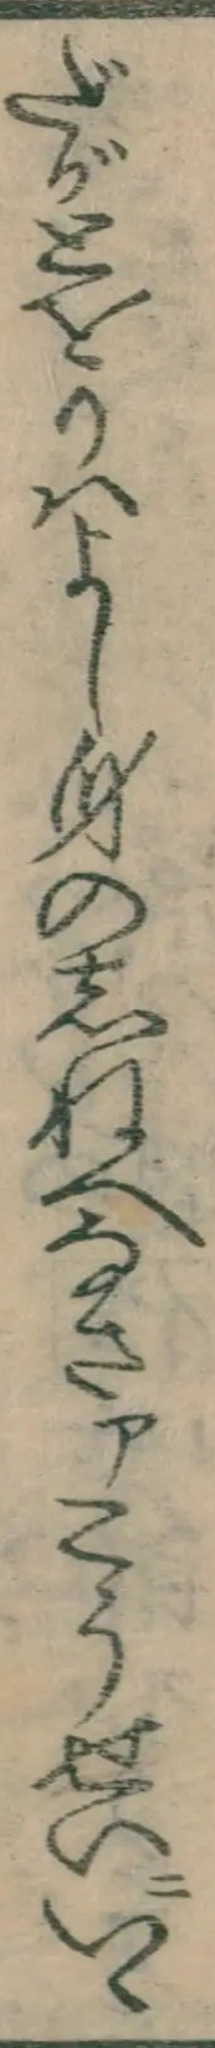だがとをりはよし身のしねへなさァこうせいにいゝ

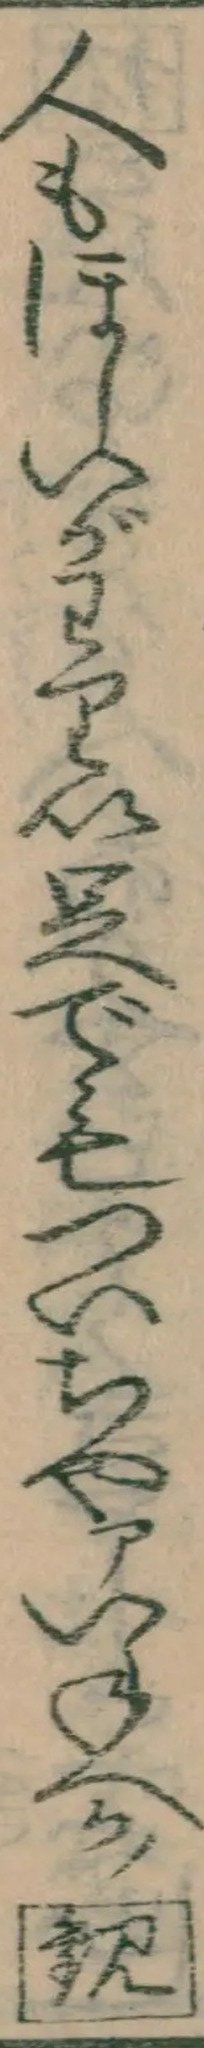人もほしいがわりい足でもついちやァいねへかノ〈観〉
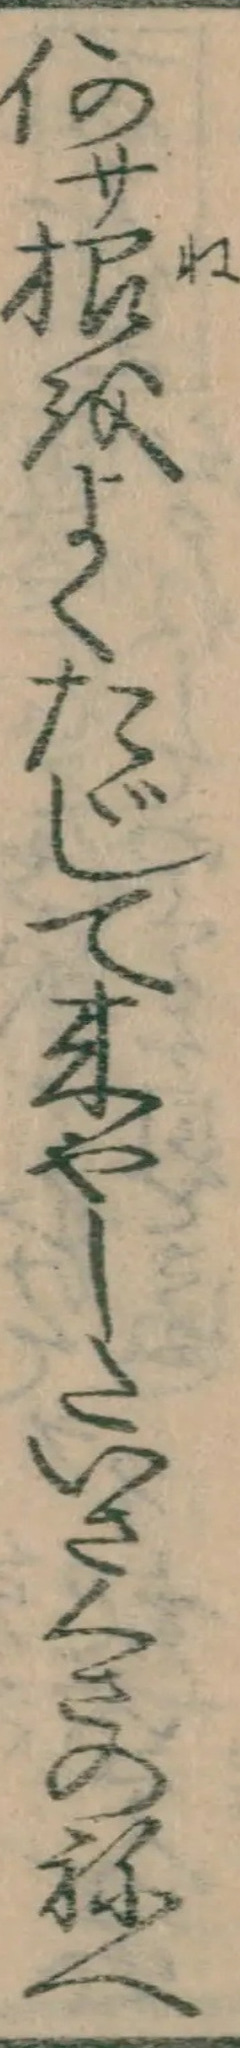何サ根をよくたゞして来やしたいさくさのねへ
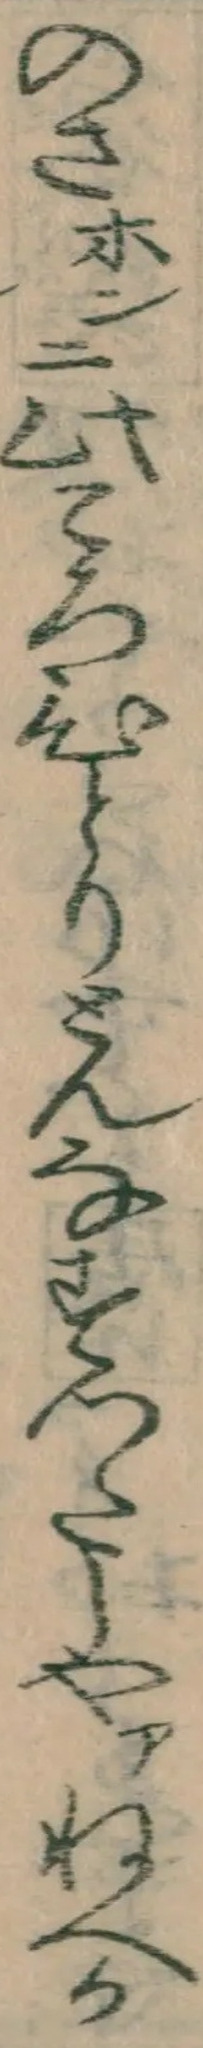のさホンニ此ころひとりとんなすつたしやァねへか
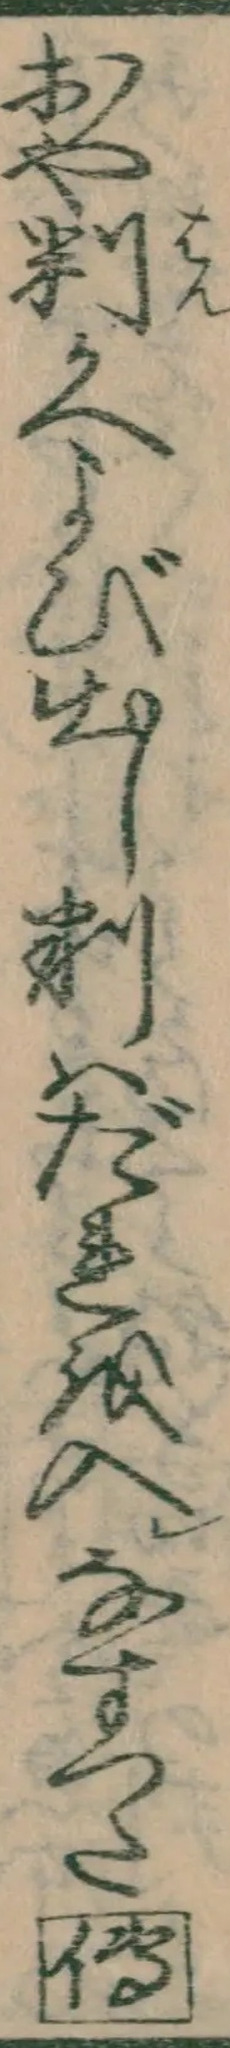おや判かへよび出し判はだれを入れなすつた〈伝〉
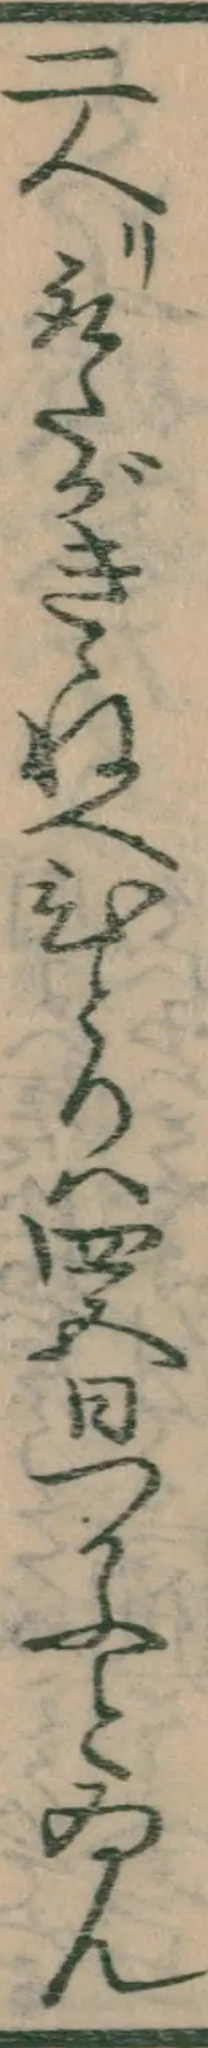二人り取たがきゝねへひとりは四五日つかふとゐん
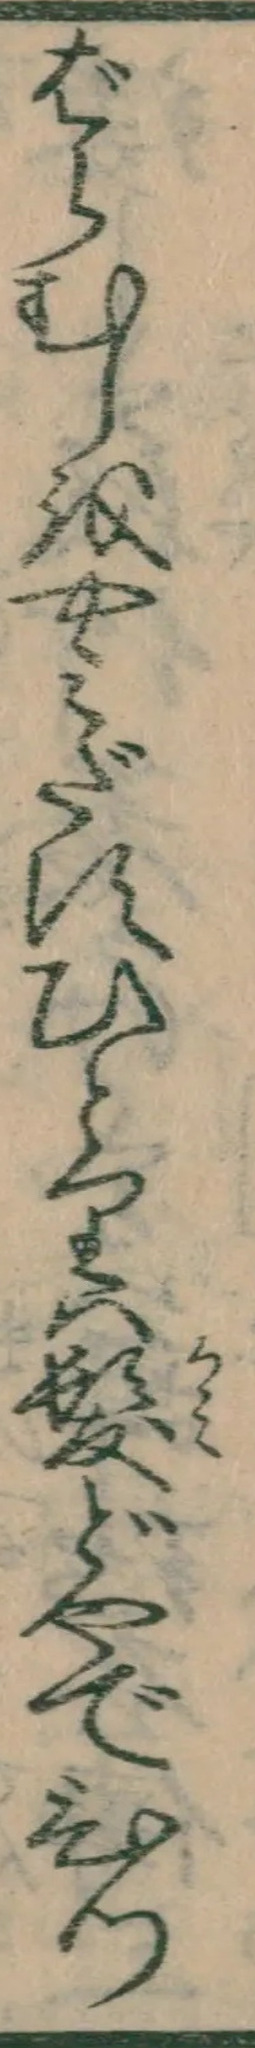ばらむしをやみだすひとりは髪どやでひつ
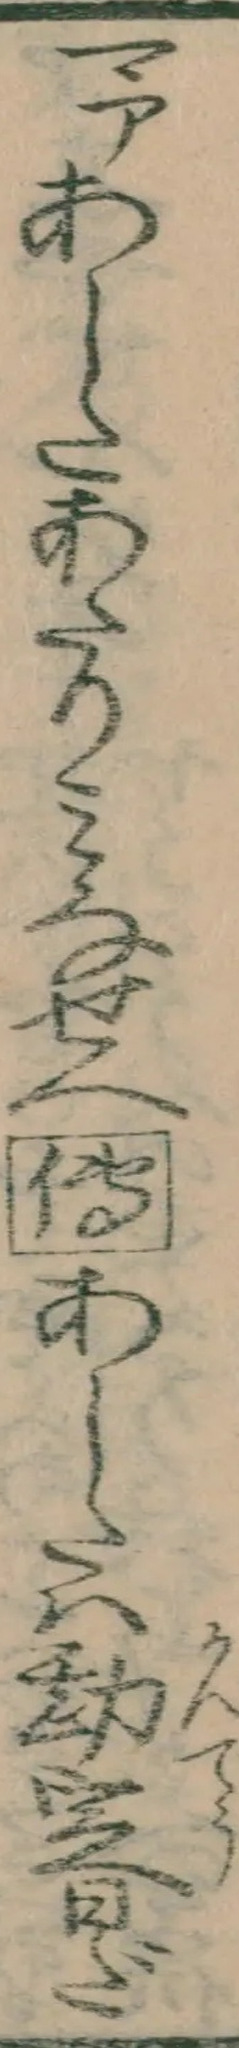マアあしたあたりみなせへ〈伝〉あしたは勘定日だ
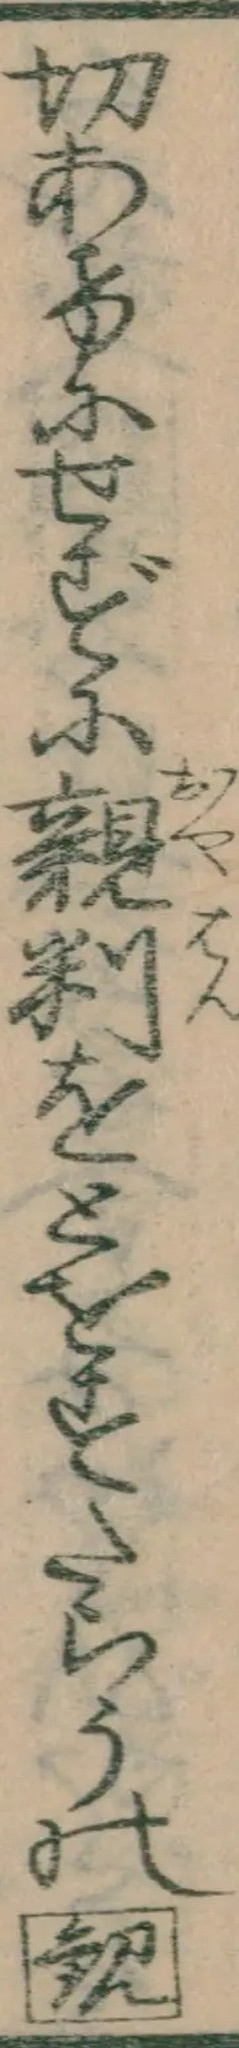切あけにせずに親判をとをすたらうの〈観〉
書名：教訓読本：大礒風俗仕懸文庫
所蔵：国立国会図書館 National Diet Library, JAPAN
